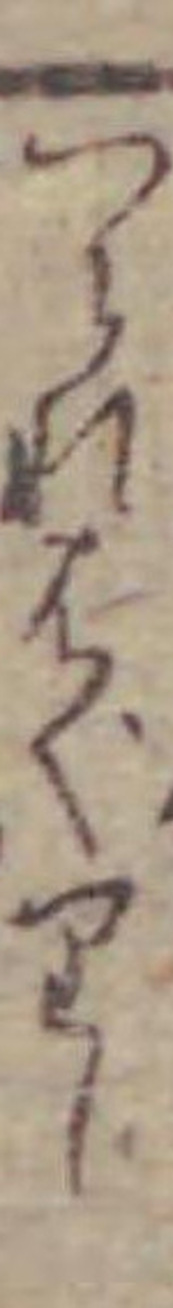つられはぐりし
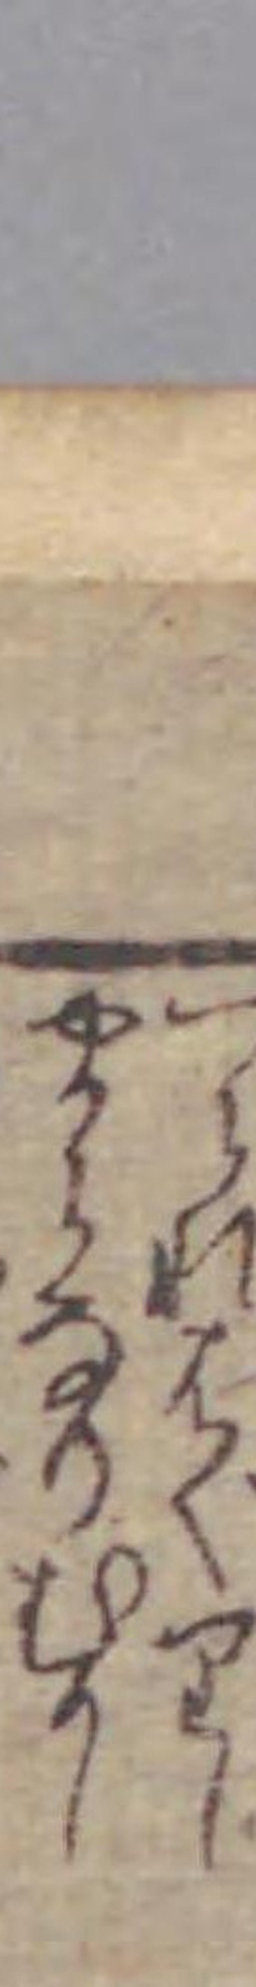やからなりむかし
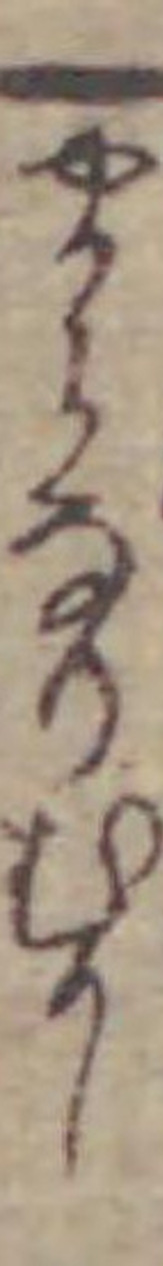やからなりむかし
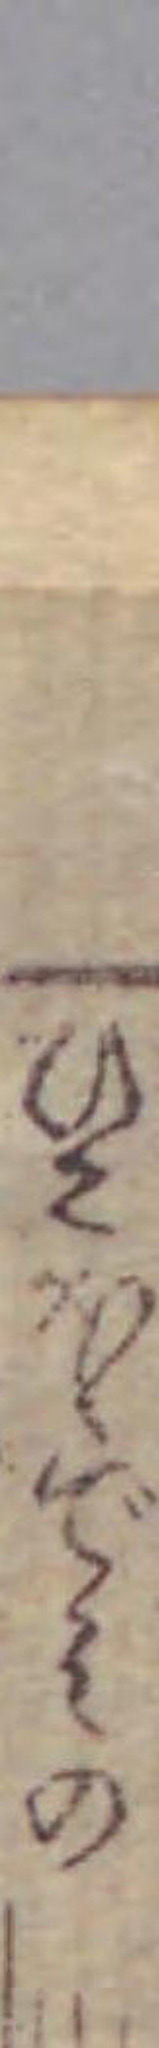ひこほゝでみの
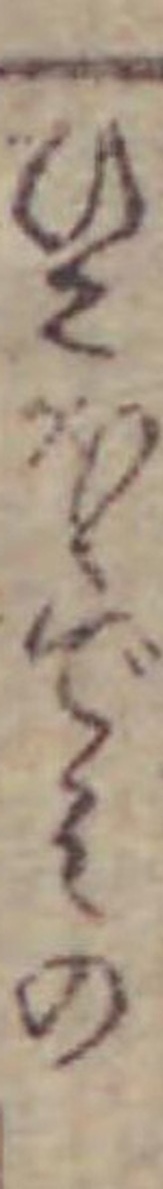ひこほゝでみの
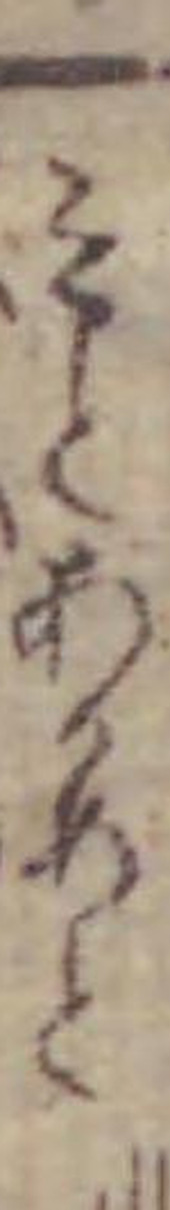みことあかめと
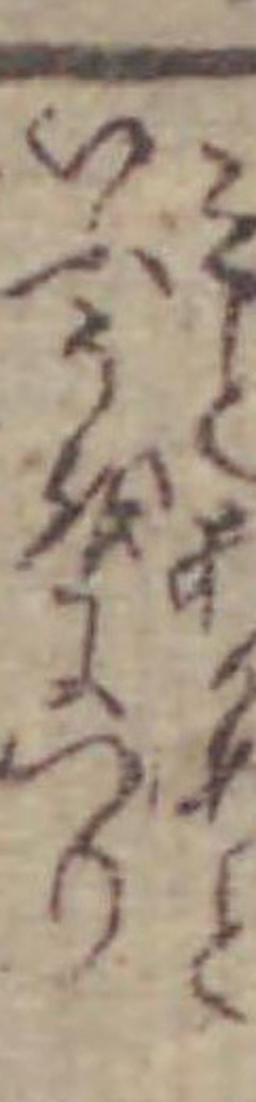いふうをにつり
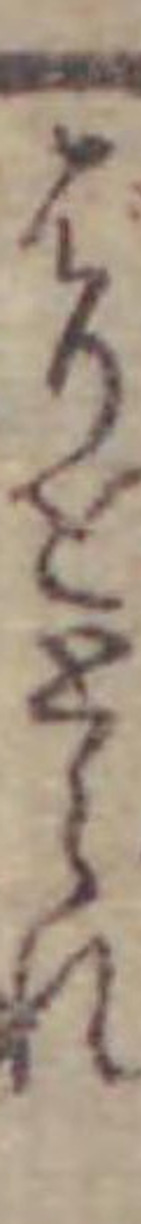ばりをとられ
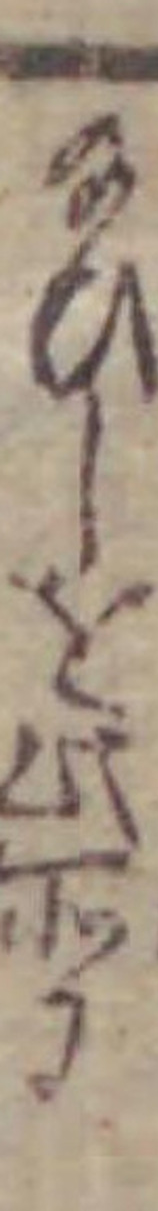給ひしを此所に
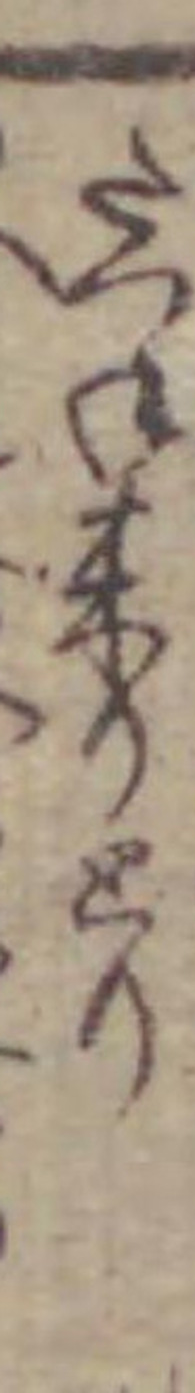たつね来りとり
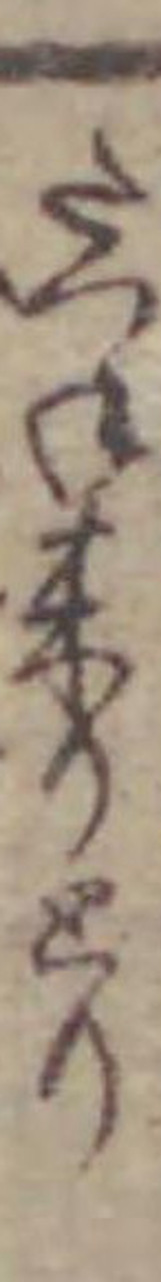たつね来りとり
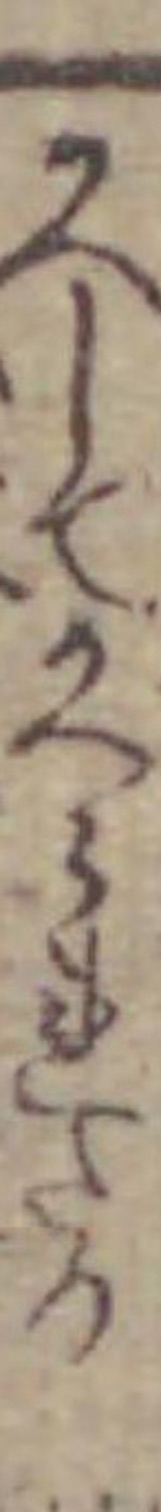かへしてかへられたる
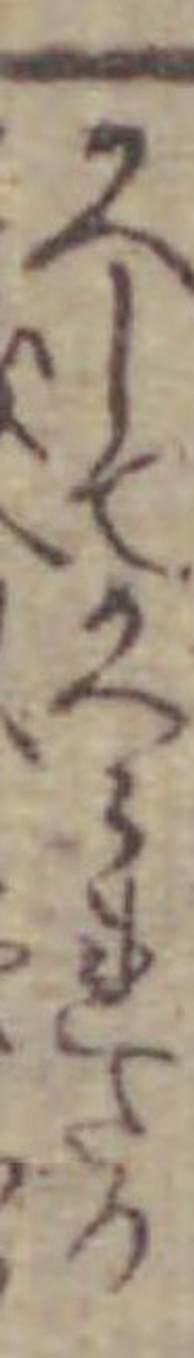かへしてかへられたる
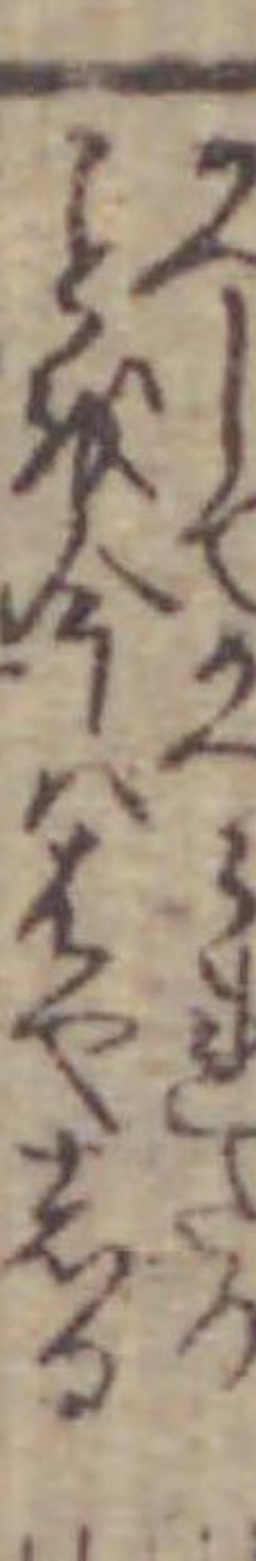ことを今ははやしる
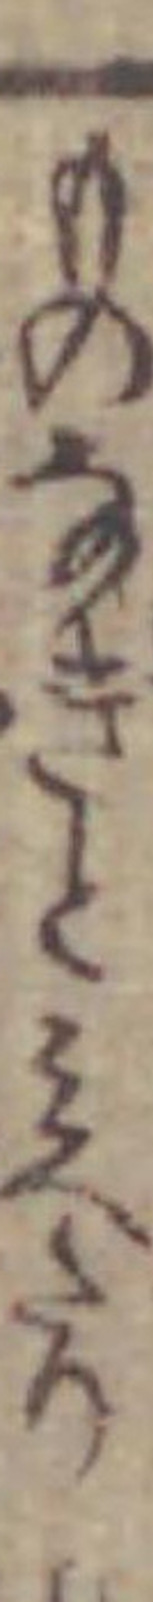ものなきとみへたり
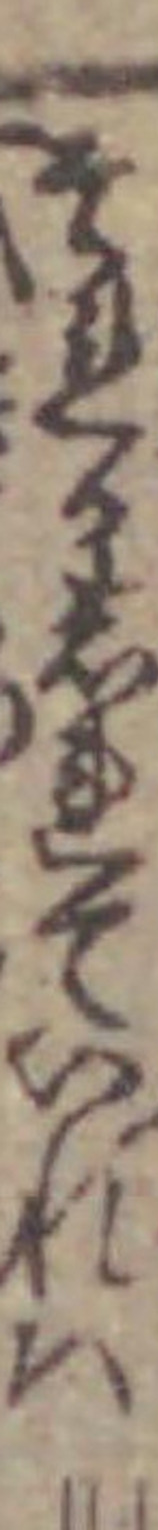それかしれていれは
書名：即席耳学問 : 3巻
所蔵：国立国会図書館 National Diet Library, JAPAN
